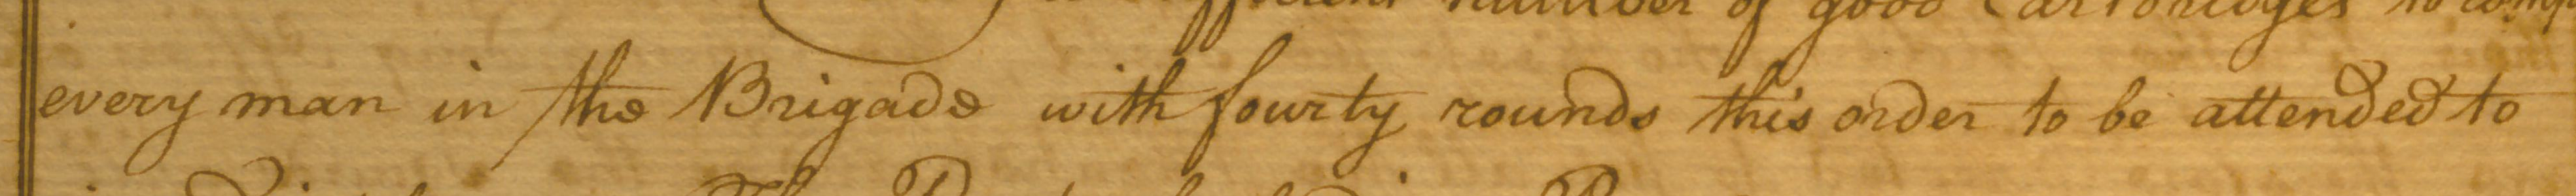every man in the Brigade with fourty rounds this order to be attended to
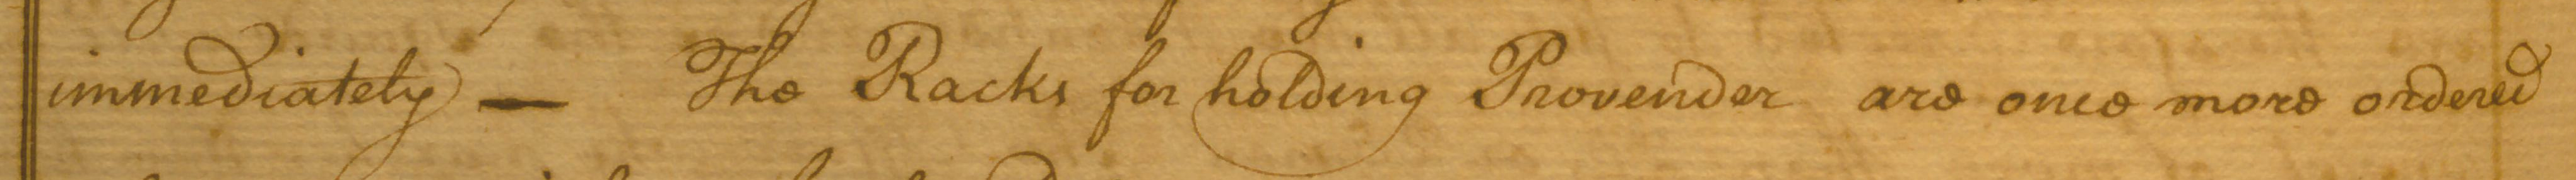immediately- The Racks for holding Provender are once more ordered
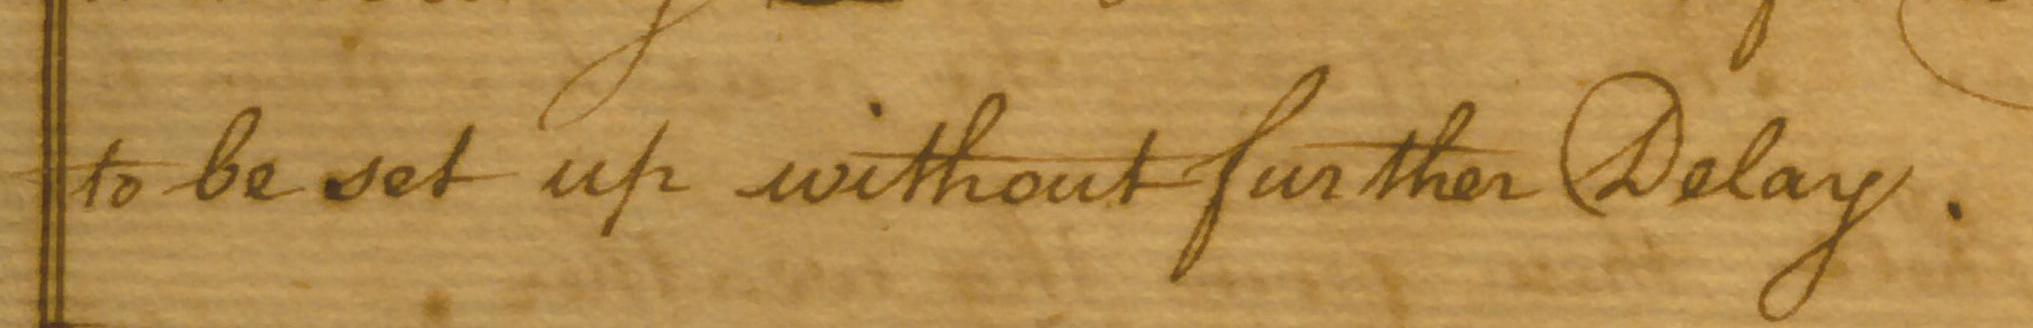to be set up without further Delay.
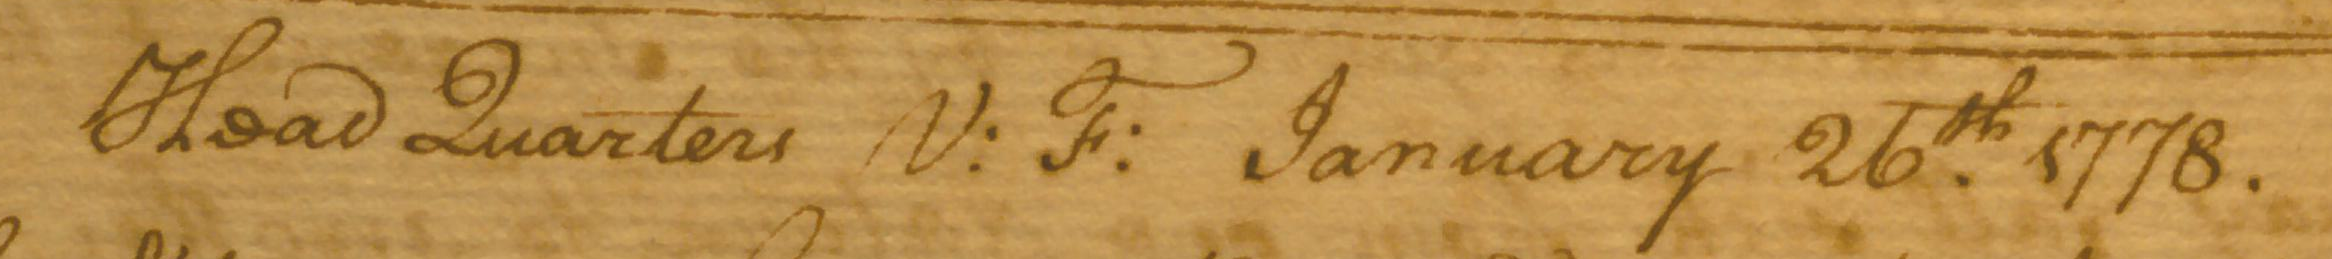Head Quarters V: F: January 26^th. 1778.
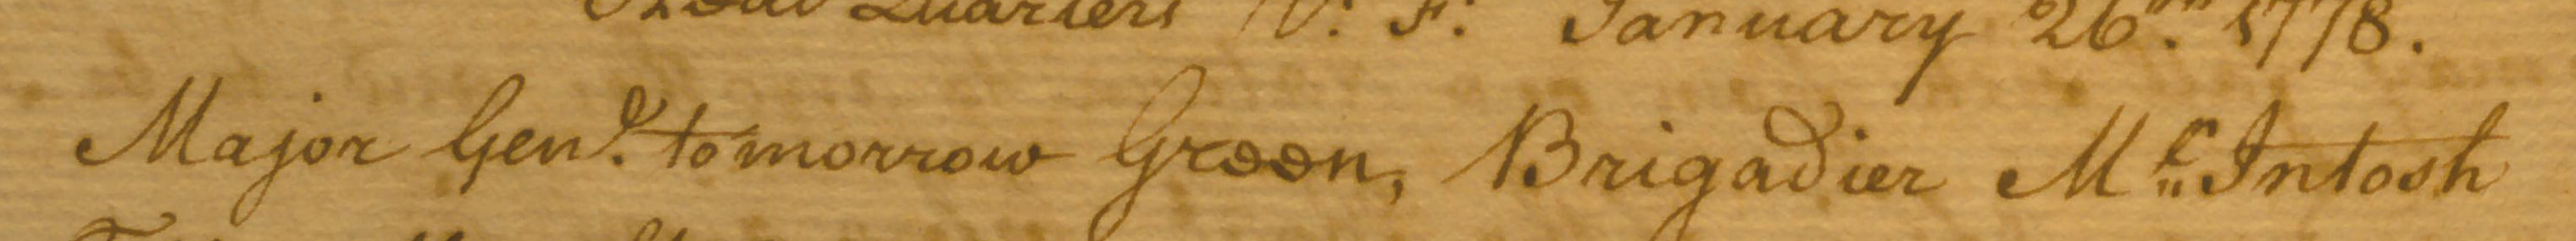Major Gen^l. tomorrow Green, Brigadier M^c.Intosh
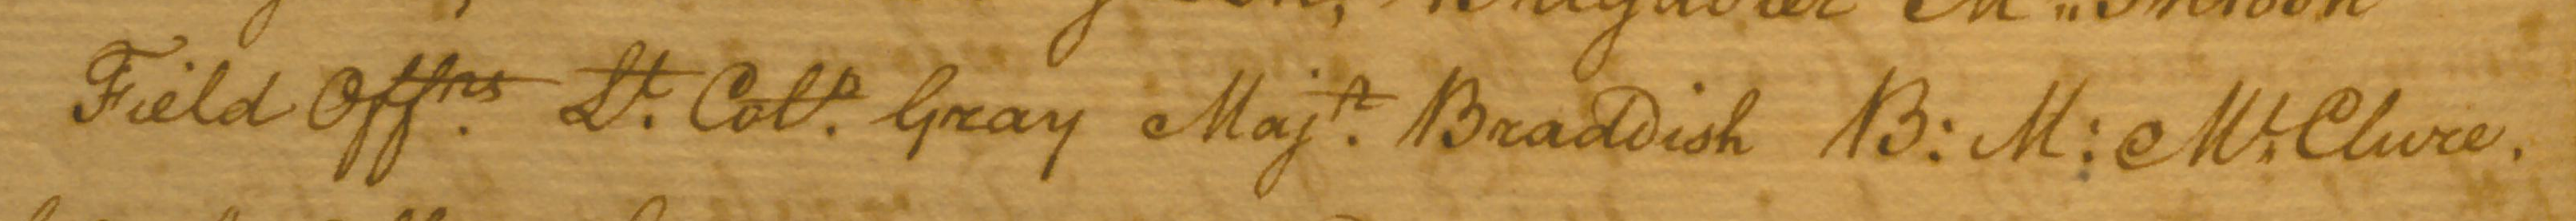Field Off^rs. L^t. Col^o. Gray Maj^r. Braddish B: M: M^c.Clure.
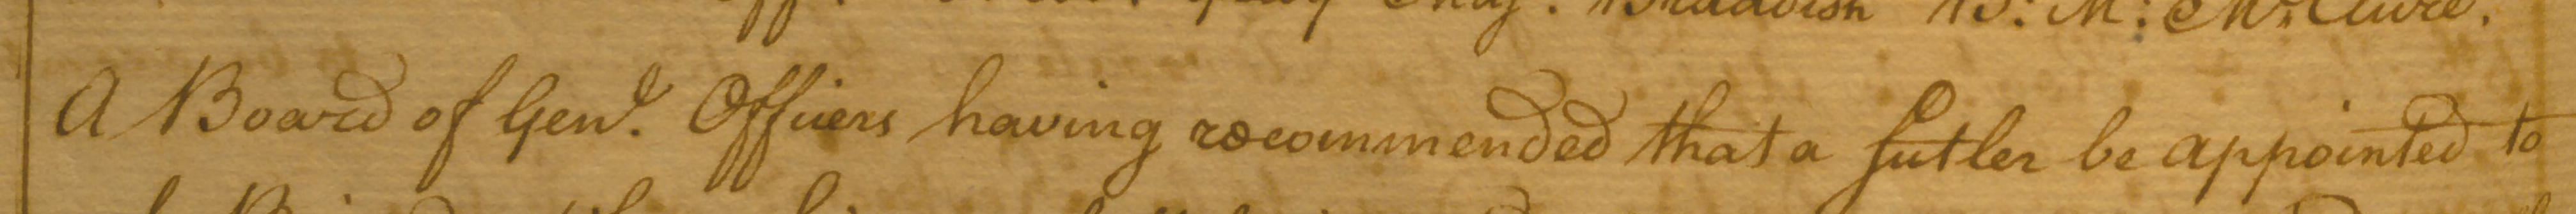A Board of Gen^l. Officers having recommended that a sutler be appointed to
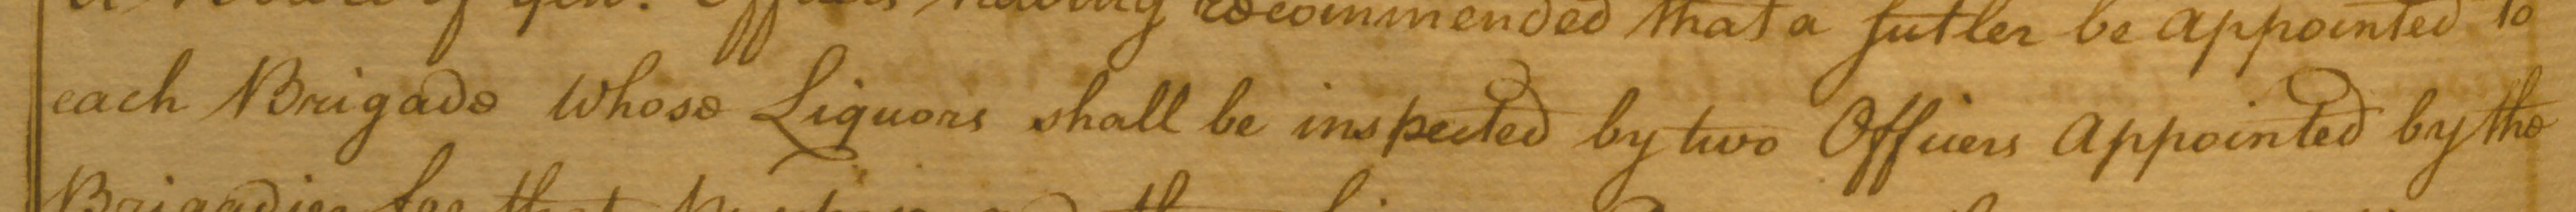each Brigade whose Liquors shall be inspected by two Officers appointed by the
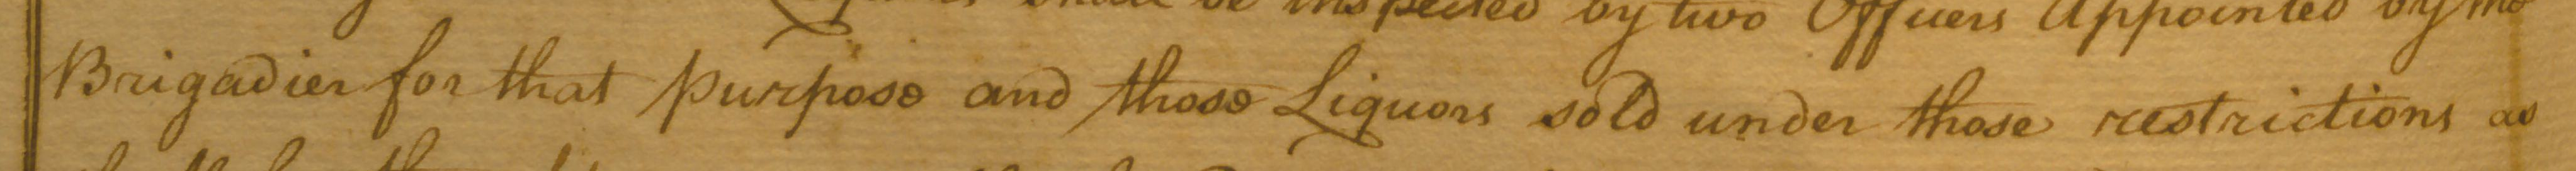Brigadier for that purpose and those Liquors sold under those restrictions as
